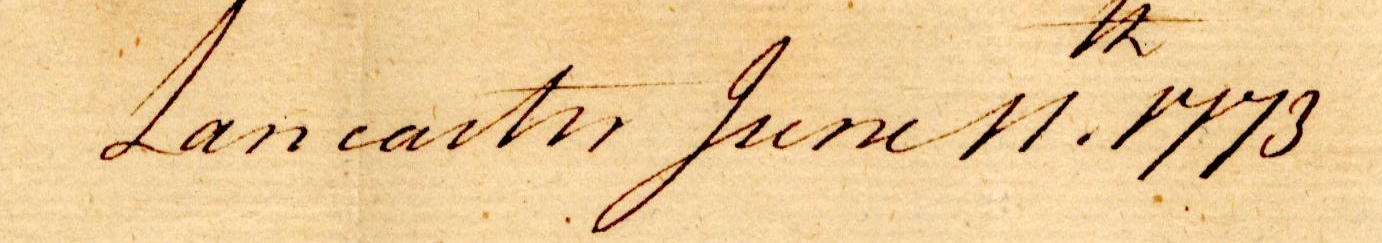Lancaster, June 11^th. 1773
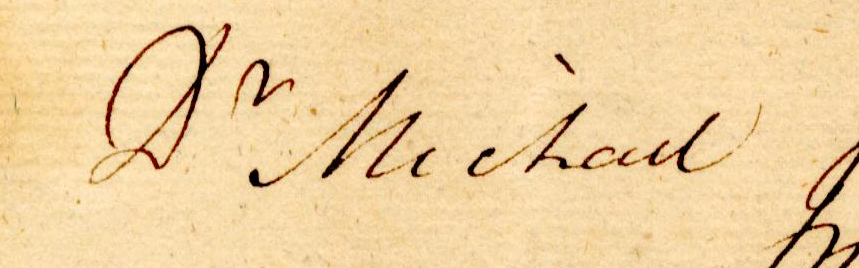D^r Michael
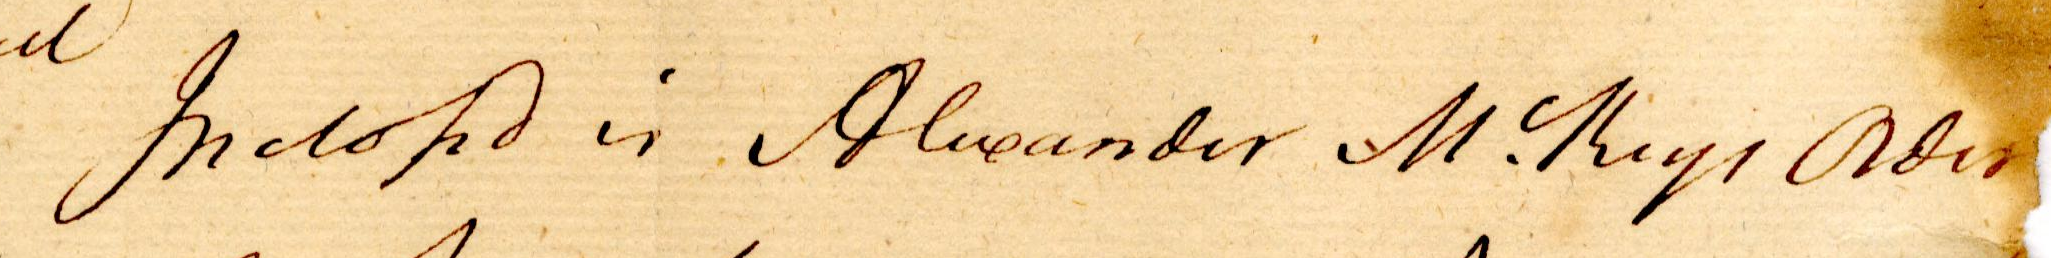Inclosed is Alexander M^c.Kays order
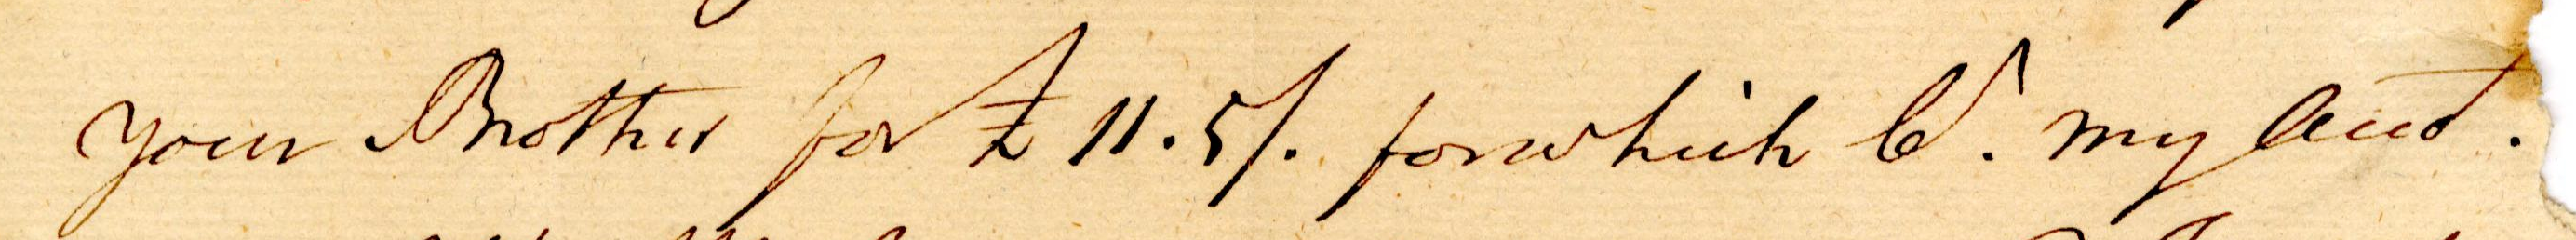your Brother for £11.5s. for which C^r. my Acco^t
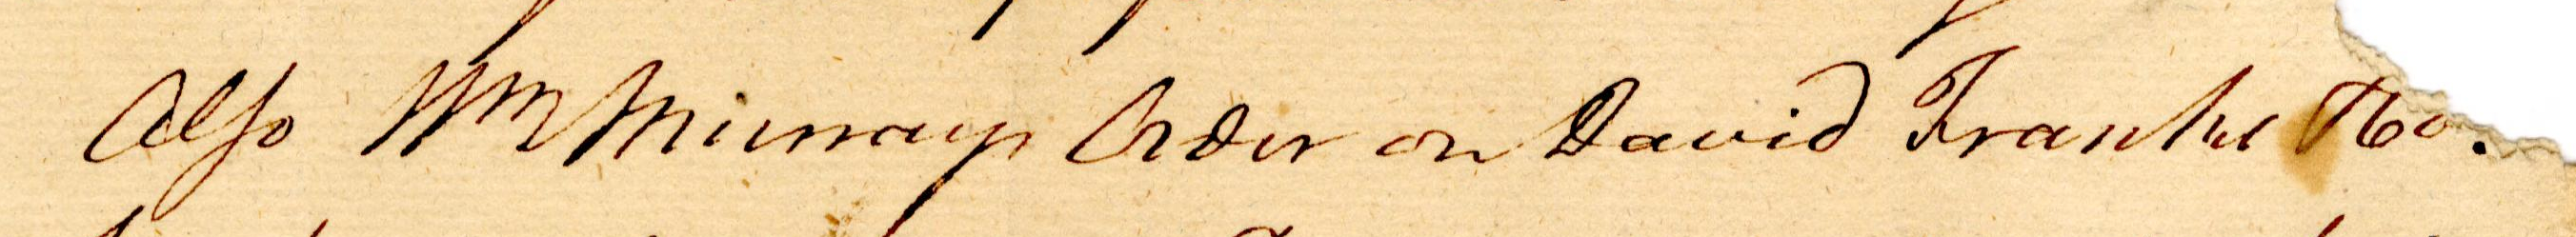Also W^m Murrays order on David Franks &Ca.
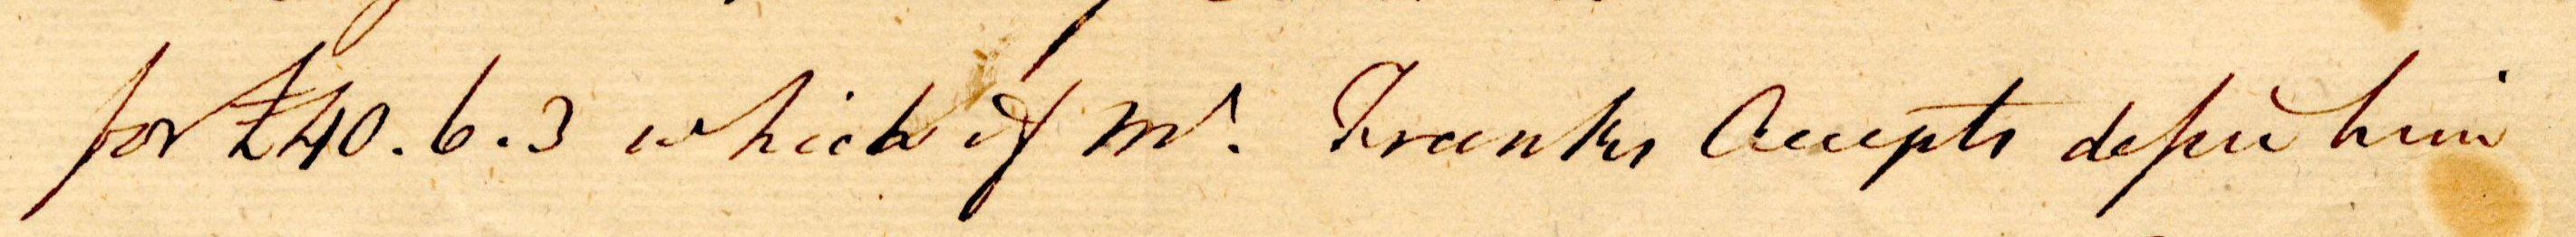for £40.6.3 which if M^r. Franks Accepts desire him
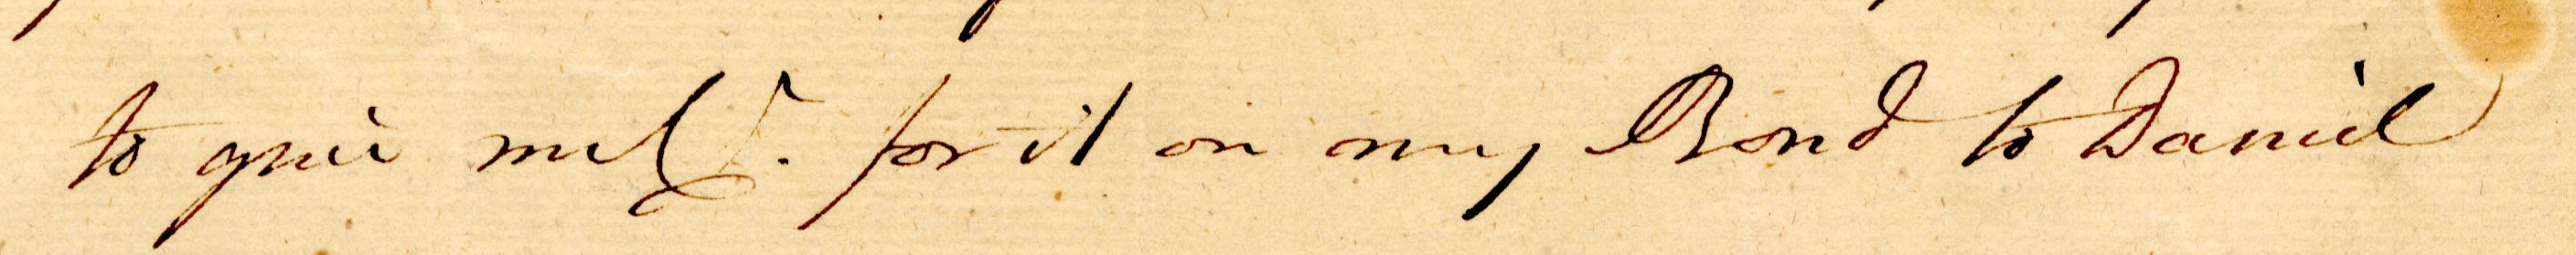to give me C^r. for it on my Bond to Daniel
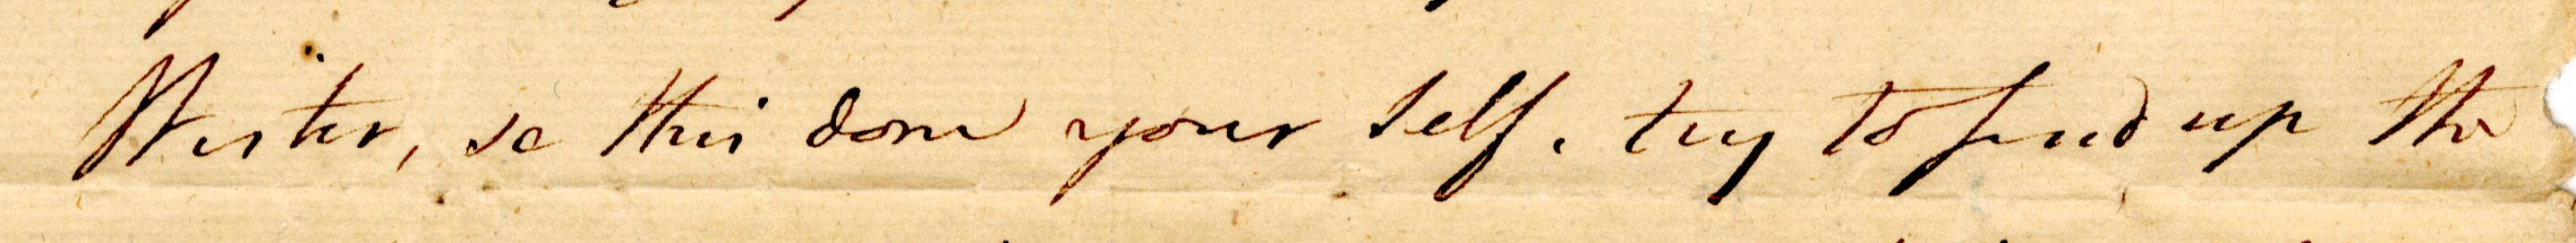Wister, so this done your Self. try to send up the
